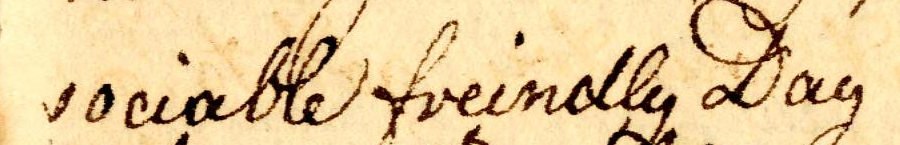sociable freindly Day
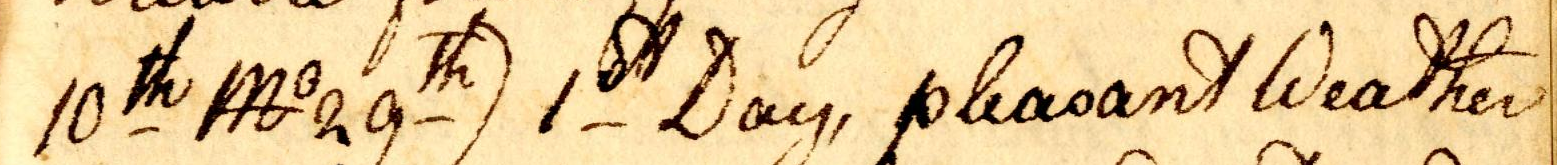10^th M^o 29^th) 1^st Day, pleasant Weather
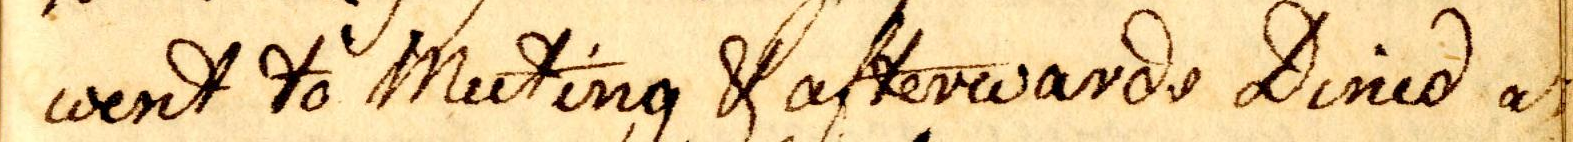went to Meeting & afterwards Dined a
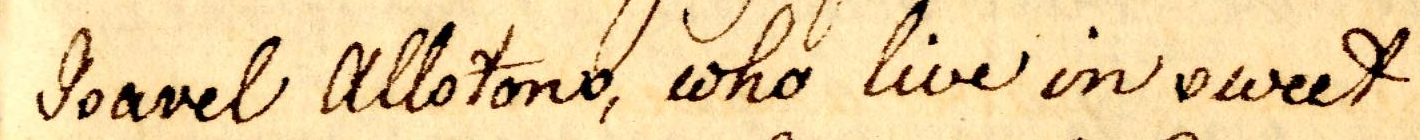Isarel Allstons, who live in sweet
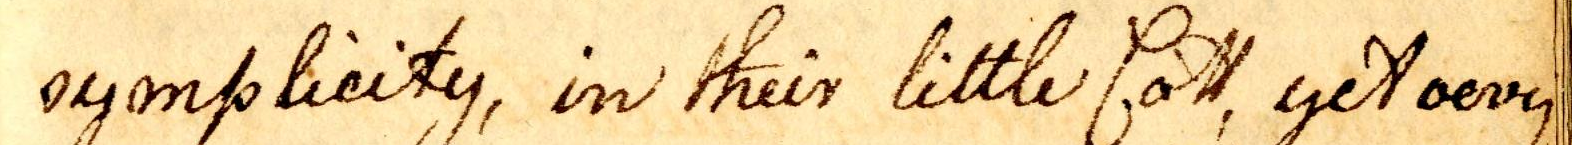symplicity, in their little Cott, yet very
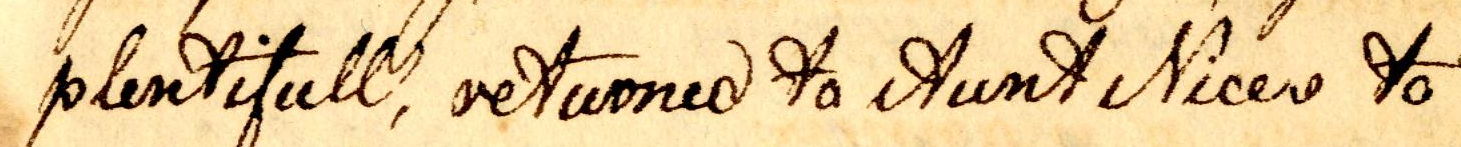plentifull, returned to Aunt Nices to
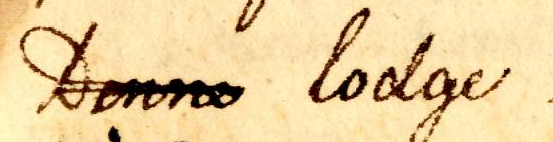[Dinne] lodge
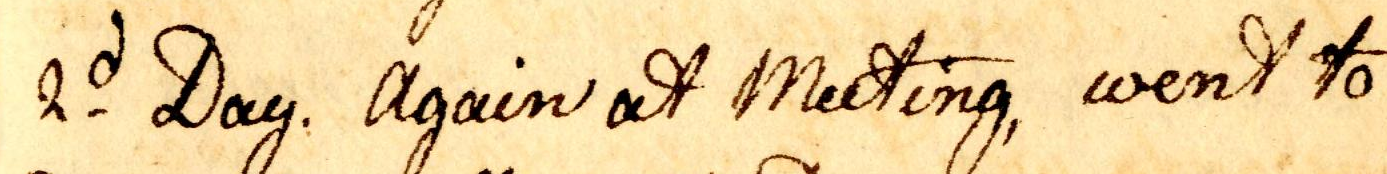2^d Day. Again at Meeting, went to
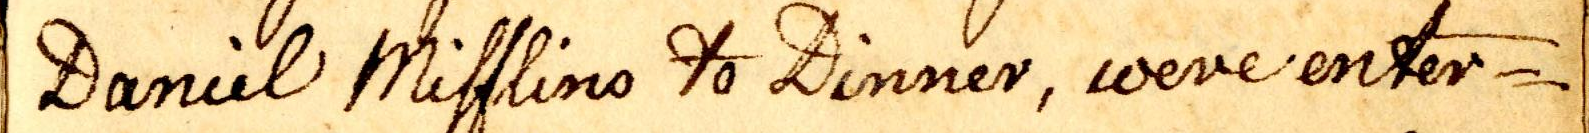Daniel Mifflins to Dinner, were enter-
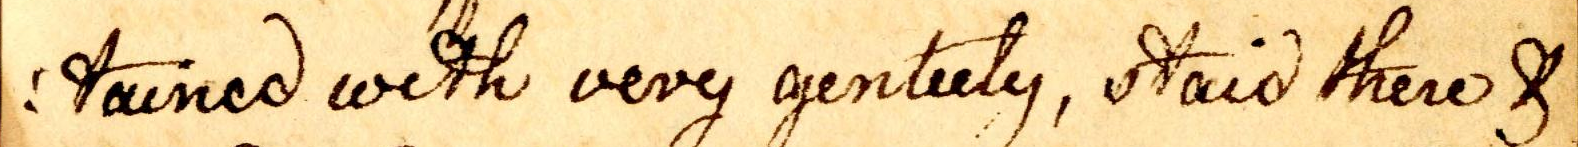-tained with very genteely, staid there &
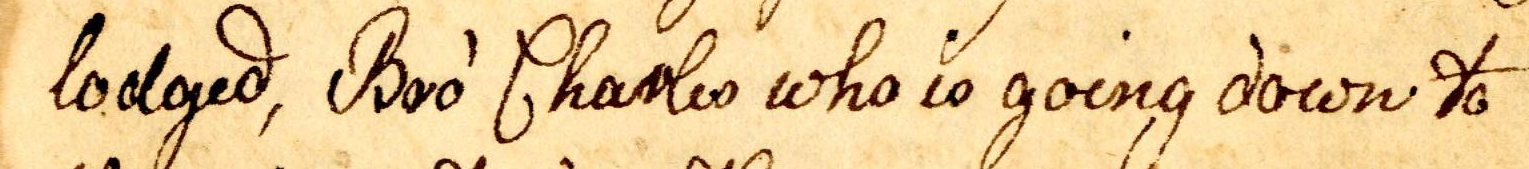lodged, Bro' Charles who is going down to
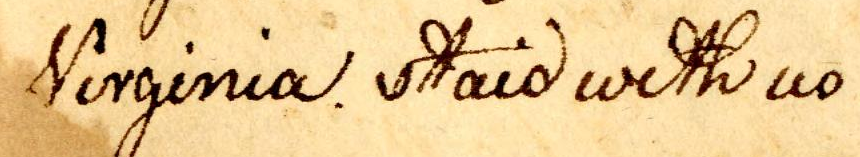Virginia. staid with us
